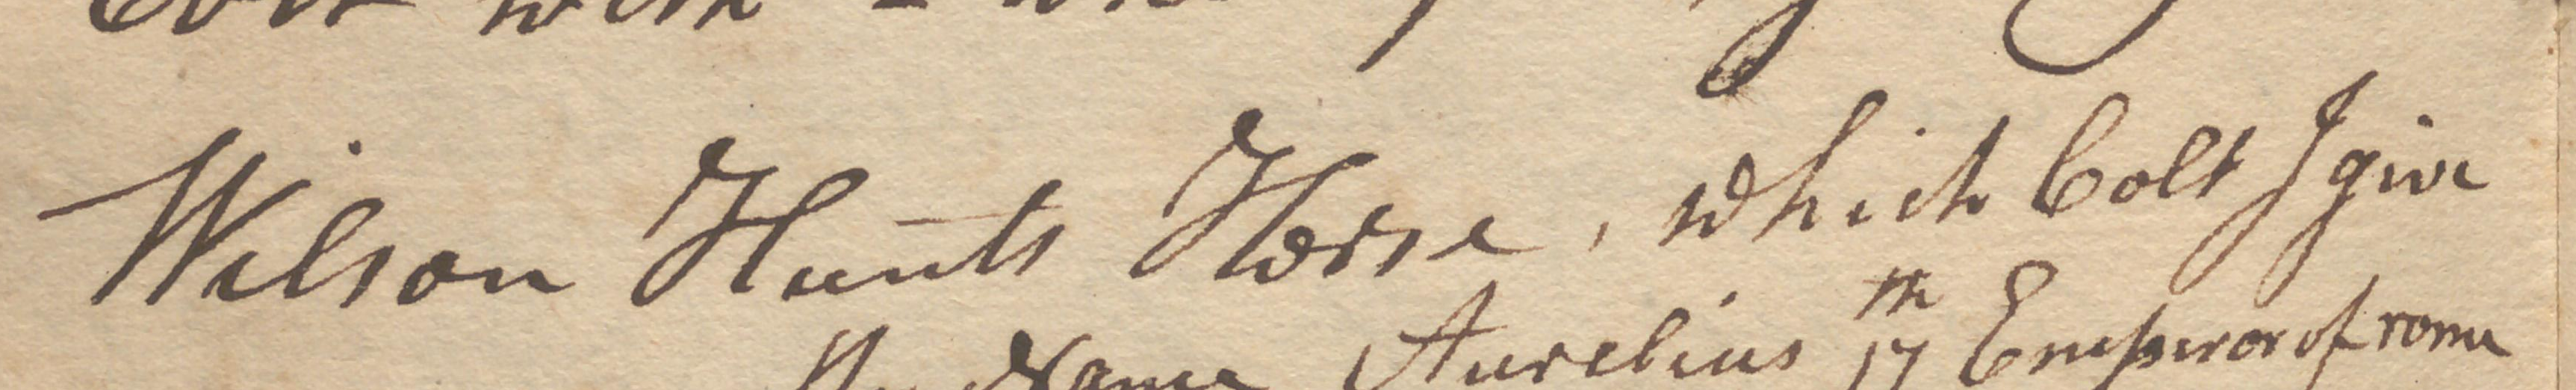Wilson Hunts Horse, which Colt I give
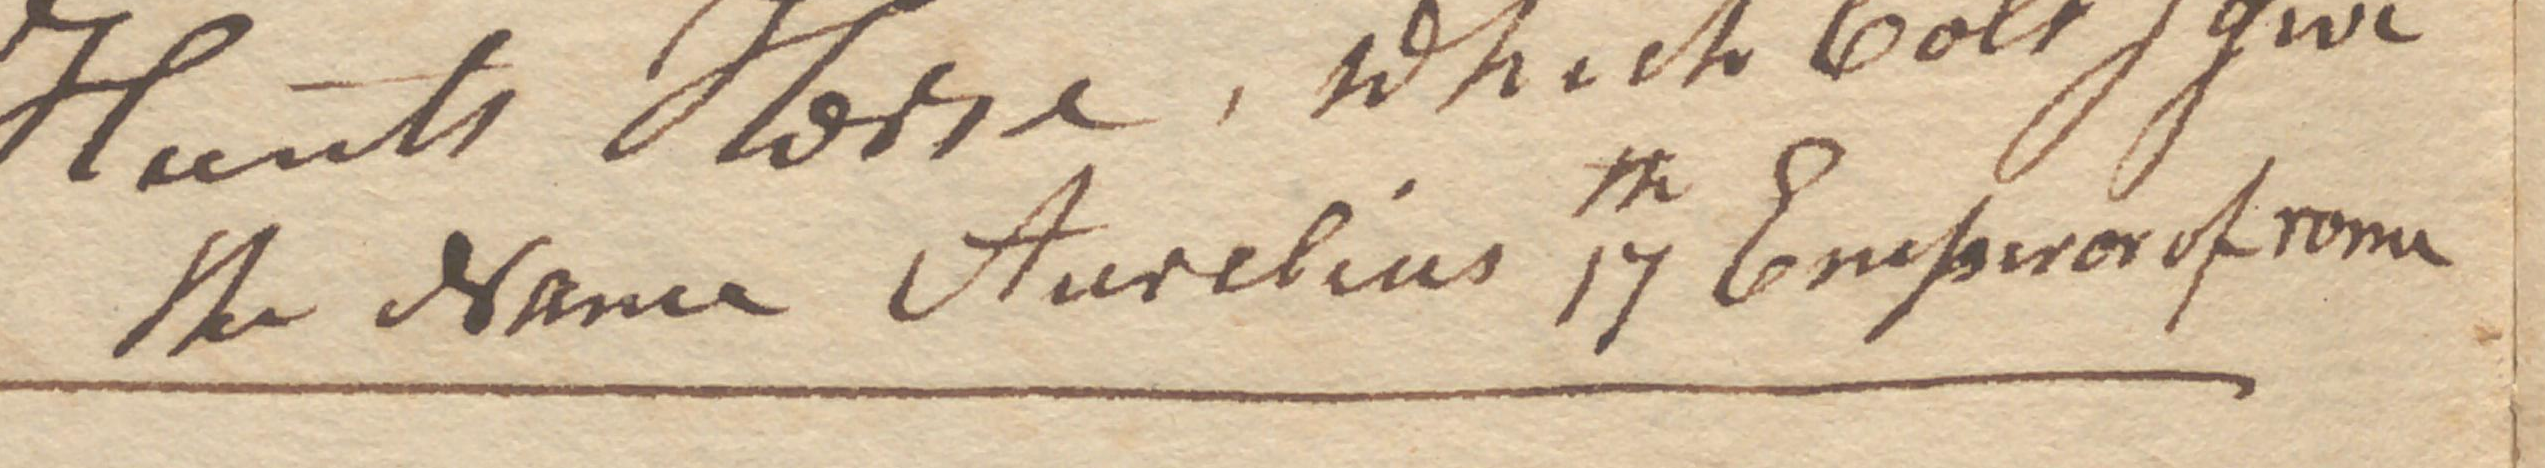the Name Aurelias 17^th Emperor of rome
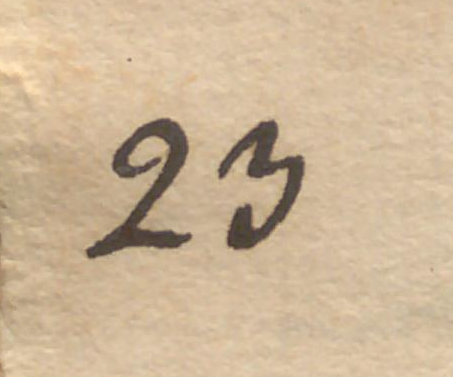23
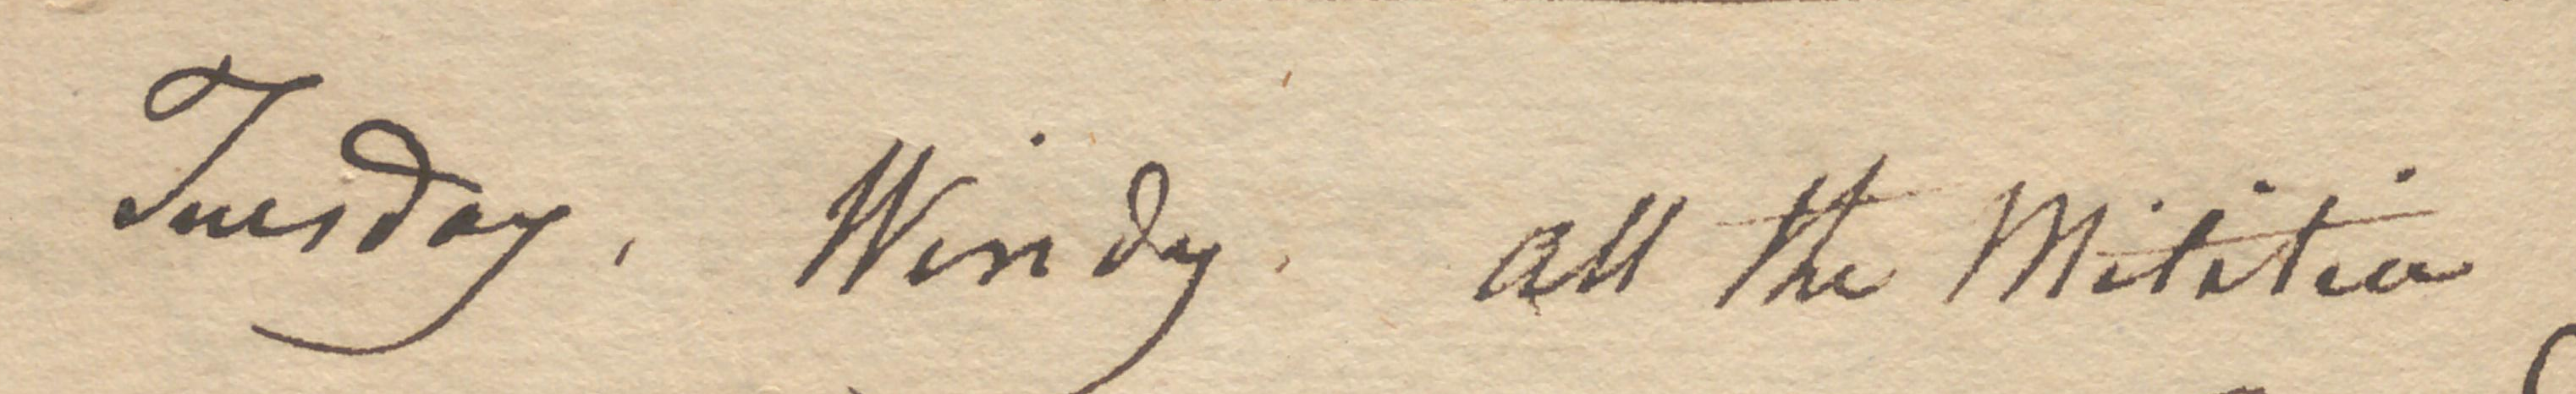Tuesday. Windy. all the Militia
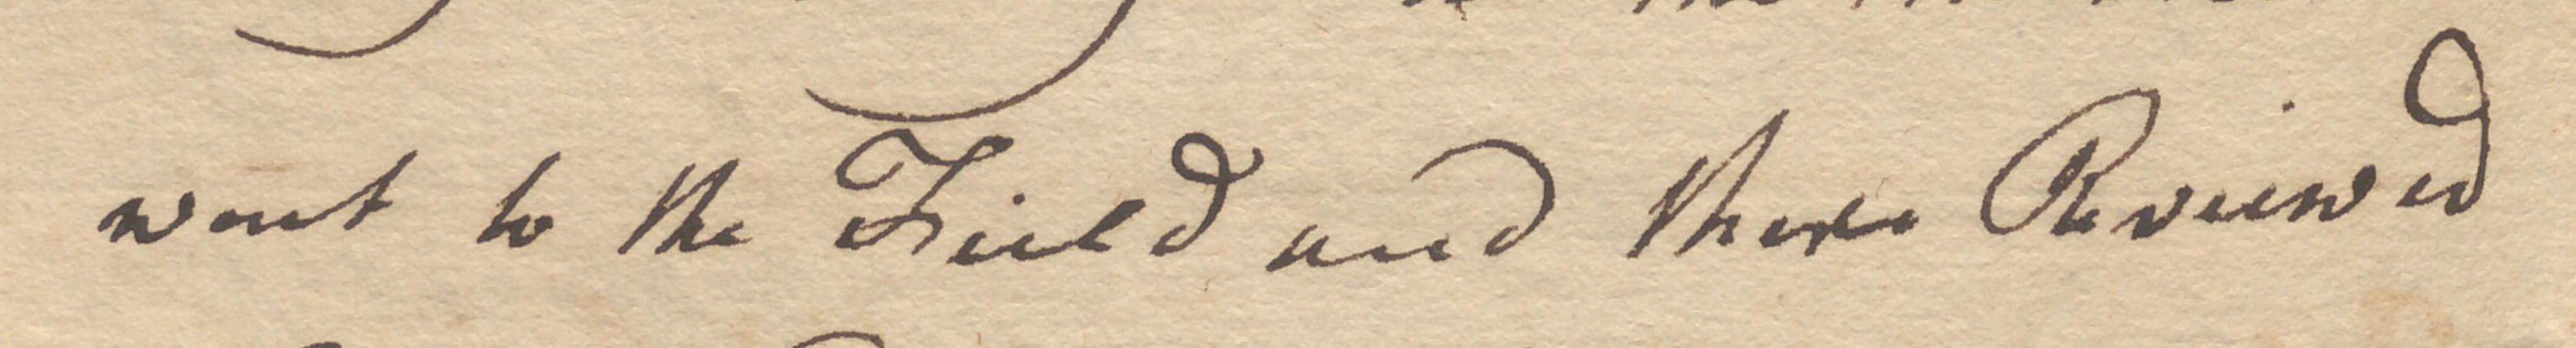went to the Field and there Reviewed
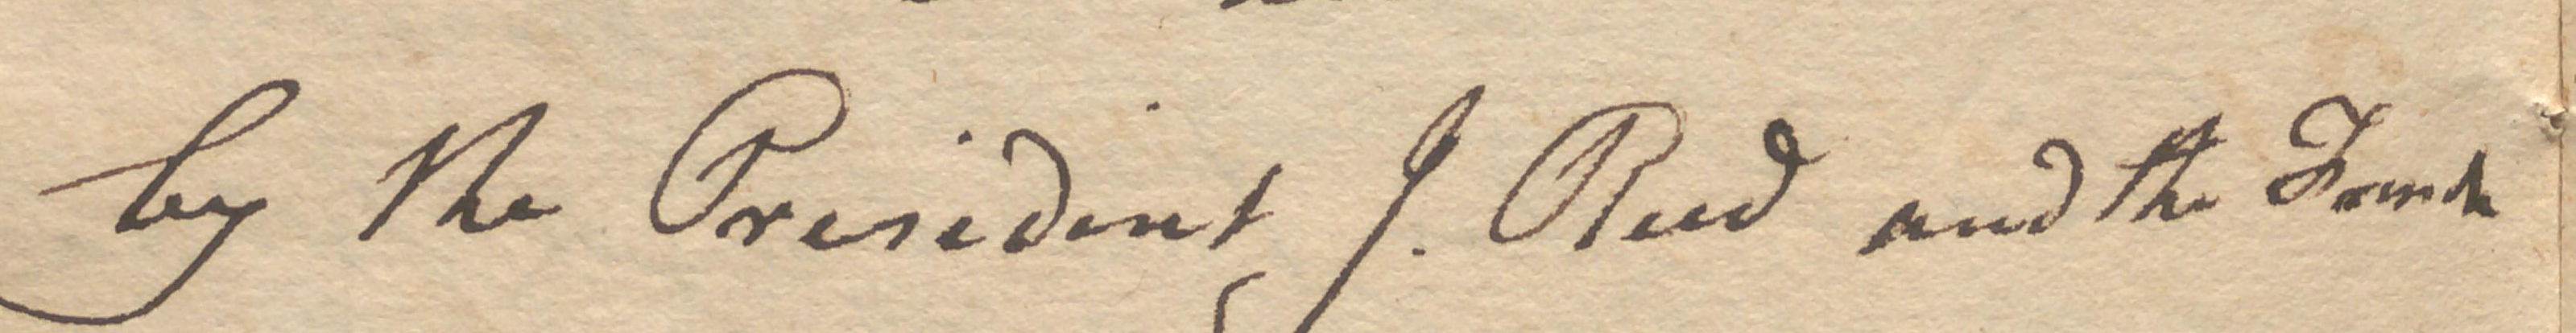by the President J. Reed and the French
